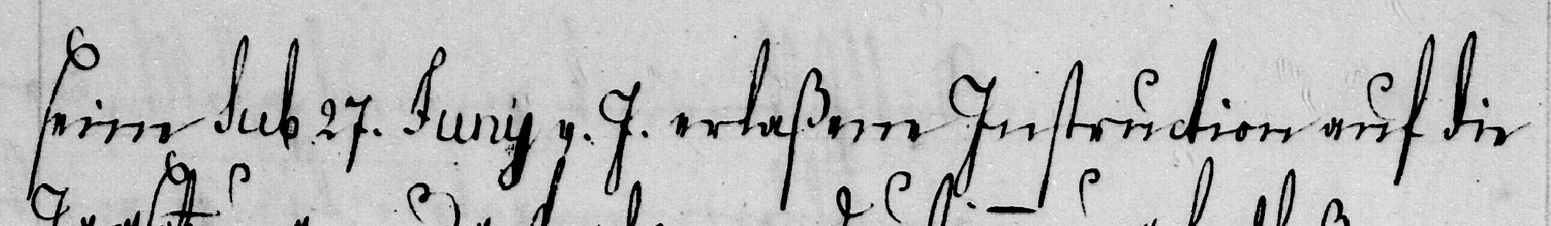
seine sub 27. Juny v. J. erlaßene Instruction auf die
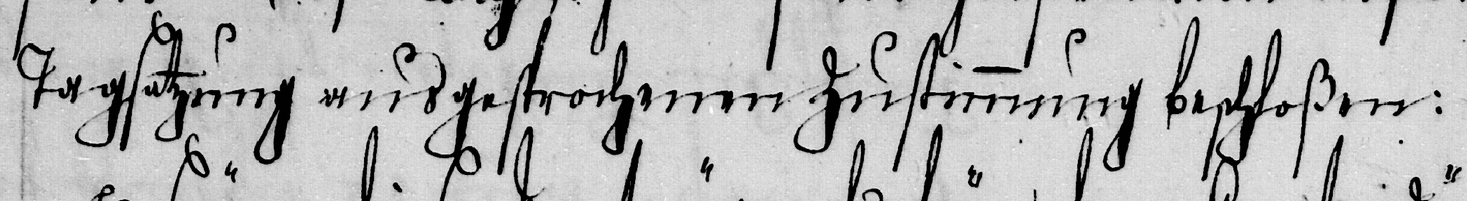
Tagsatzung ausgesprochenen Zustimmung beschloßen:
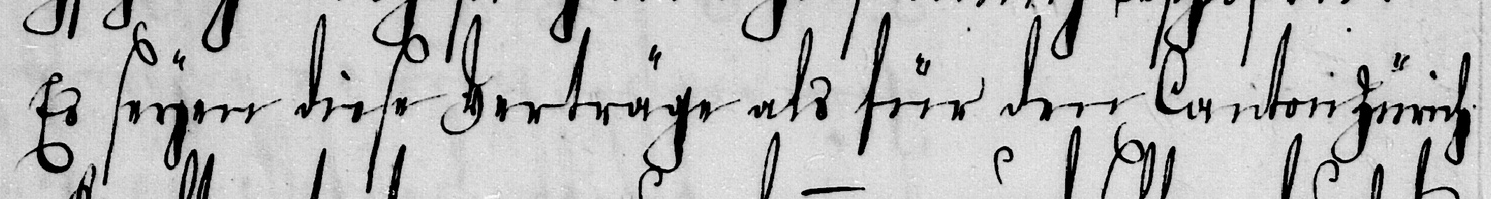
Es seyen diese Verträge als für den Canton Zürich
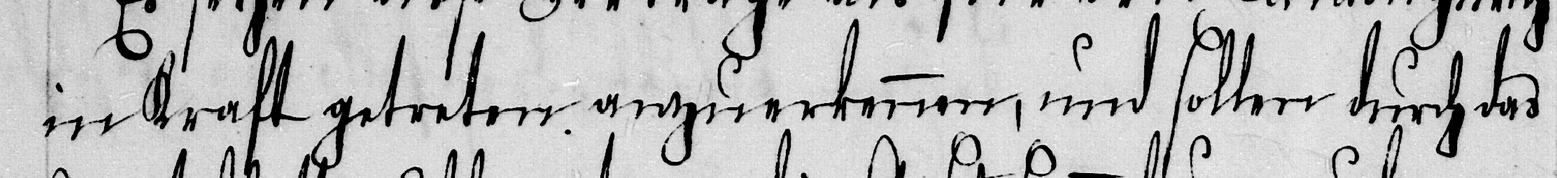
in Kraft getreten anzuerkennen, und sollen durch das
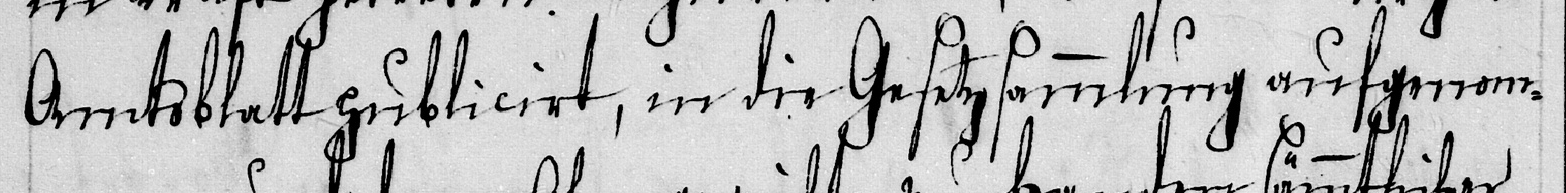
Amtsblatt publicirt, in die Gesetzgebung aufgenom¬
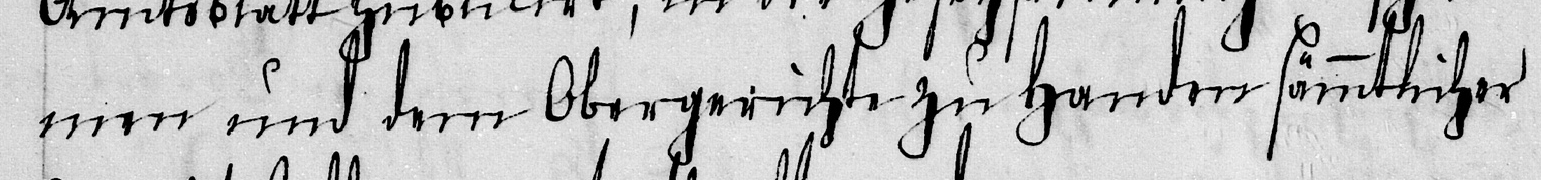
men und dem Obergerichte zu Handen sämmtlicher
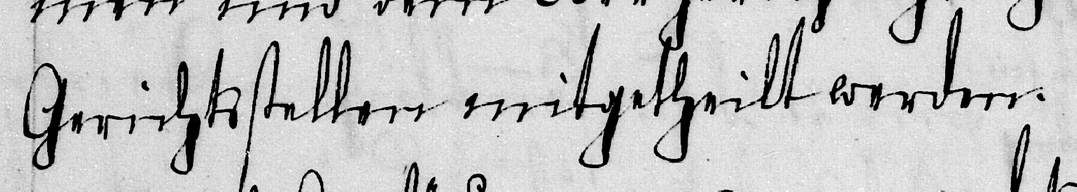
Gerichtsstellen mitgetheilt werden.
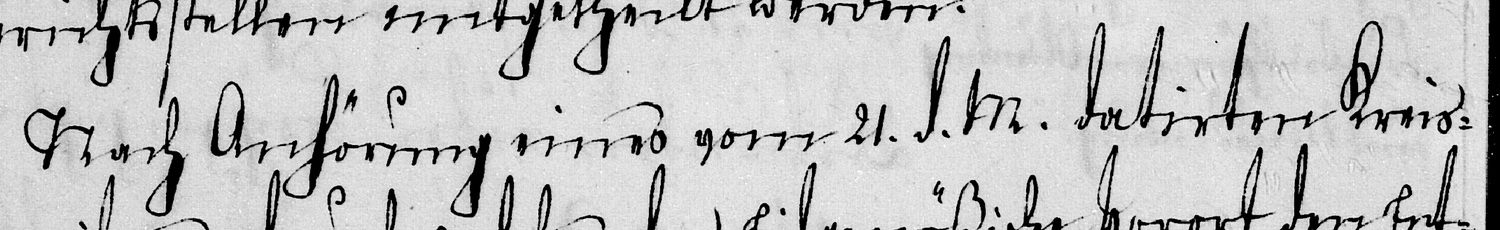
Nach Anhörung eines vom 21. d. M. datirten Kreis¬
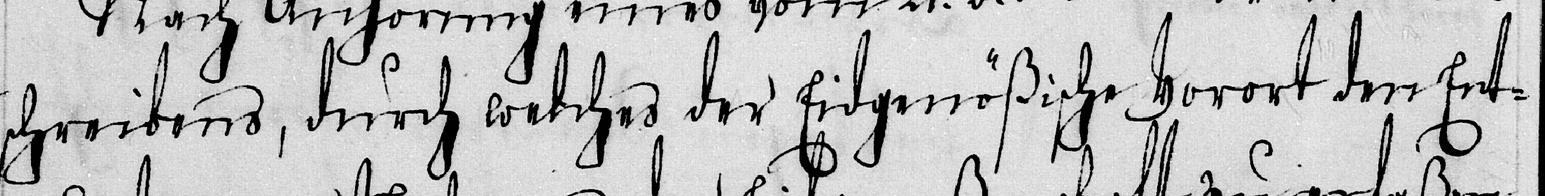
chreibens, durch welches der Eidgenößische Vorort den Ent¬
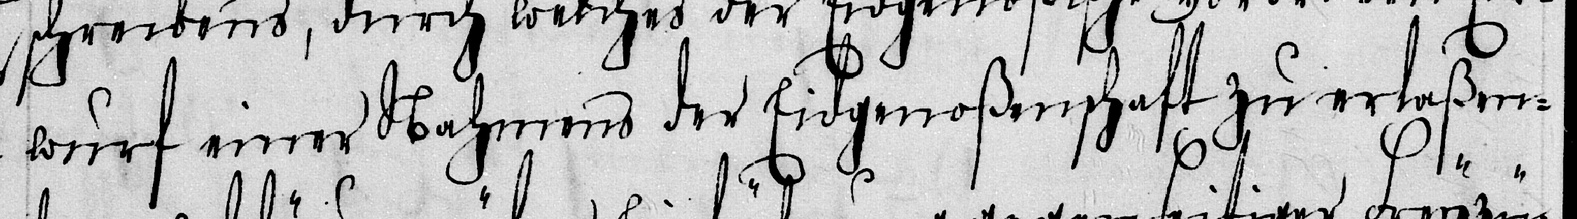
wurf einer Nahmens der Eidgenoßenschaft zu erlaßen¬
